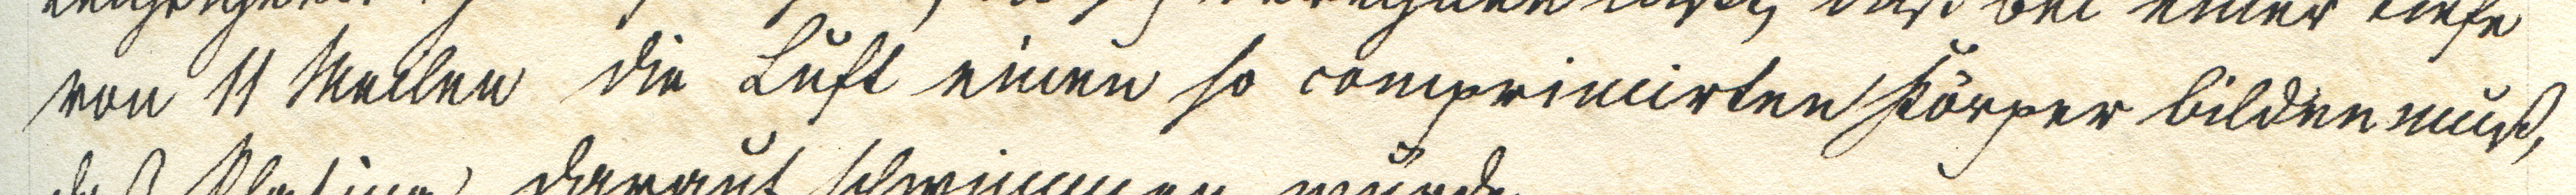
von 11 Meilen die Luft einen so comprimirten Körper bilden muß,
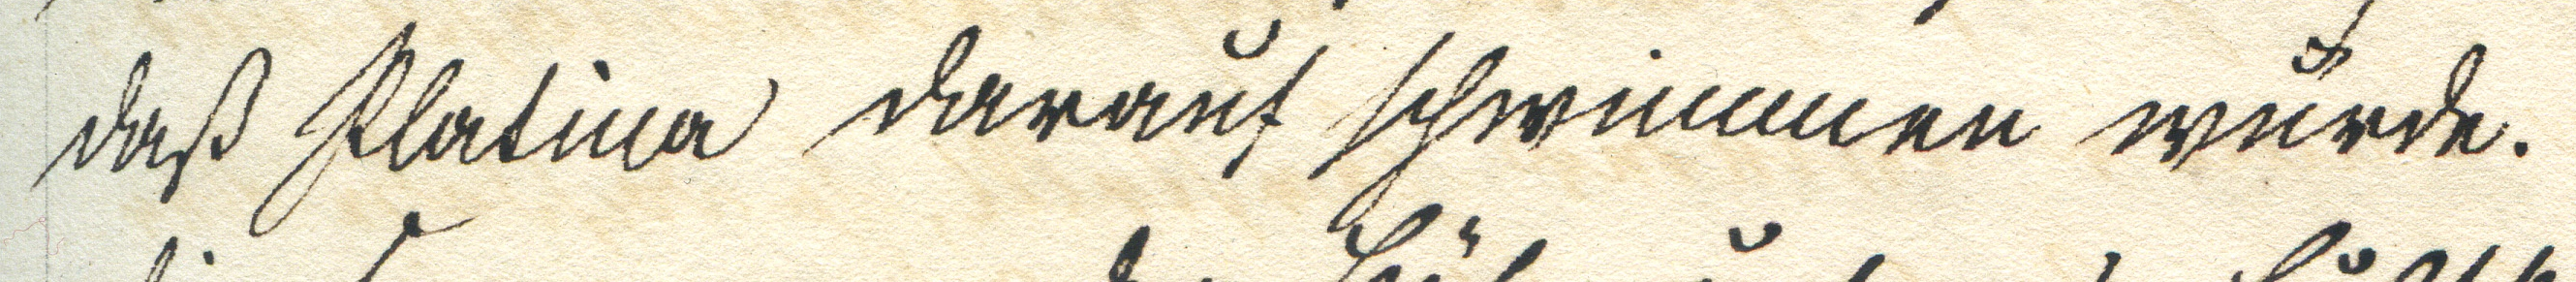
daß Platina darauf schwimmen würde.
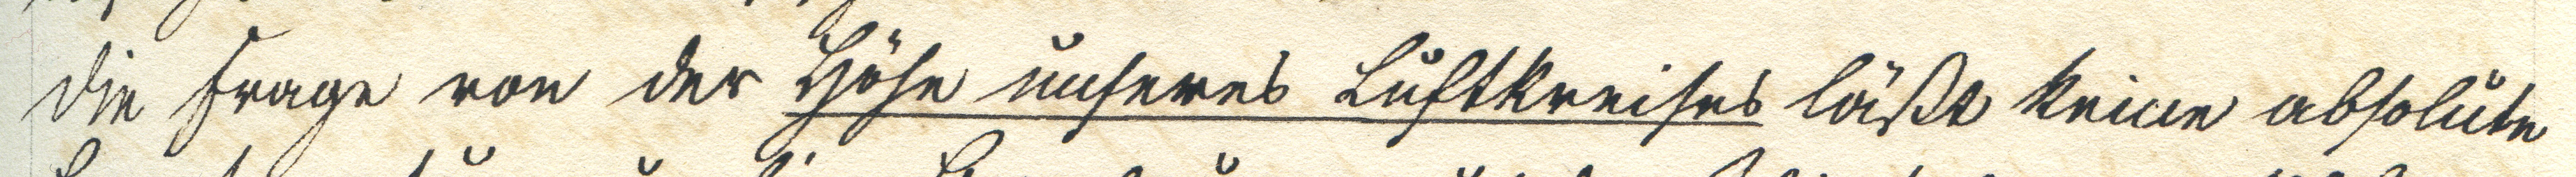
Die Frage von der Höhe unseres Luftkreises läßt keine absolute
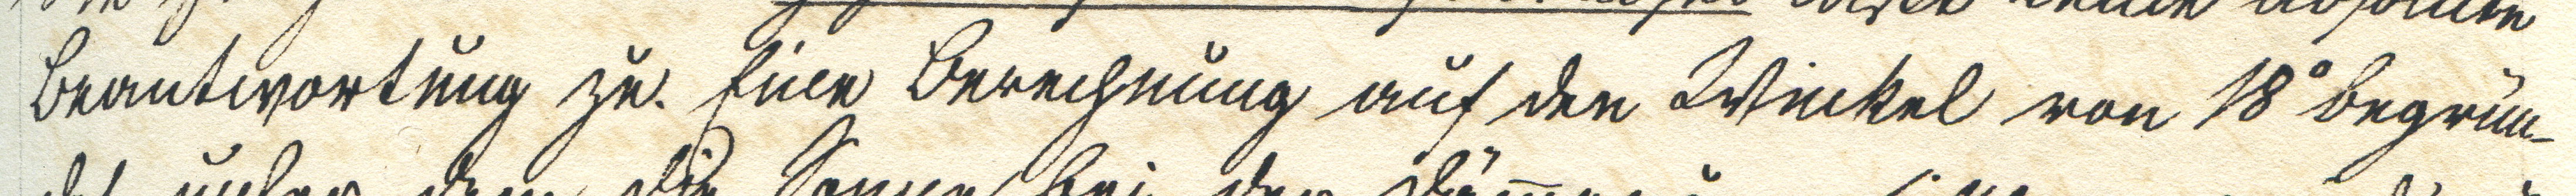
Beantwortung zu. Eine Berechnung auf den Winkel von 18° begrün-
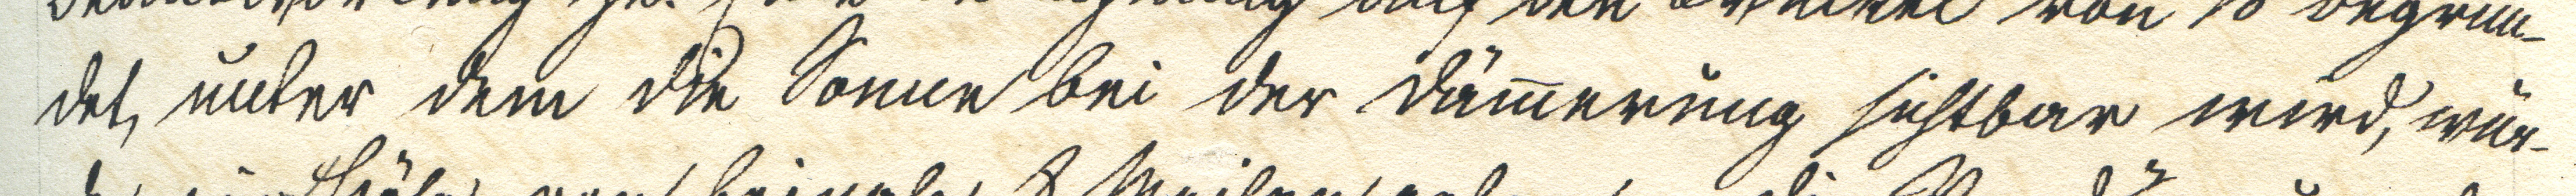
det, unter dem die Sonne bei der Däm̃erung sichtbar wird, wür-
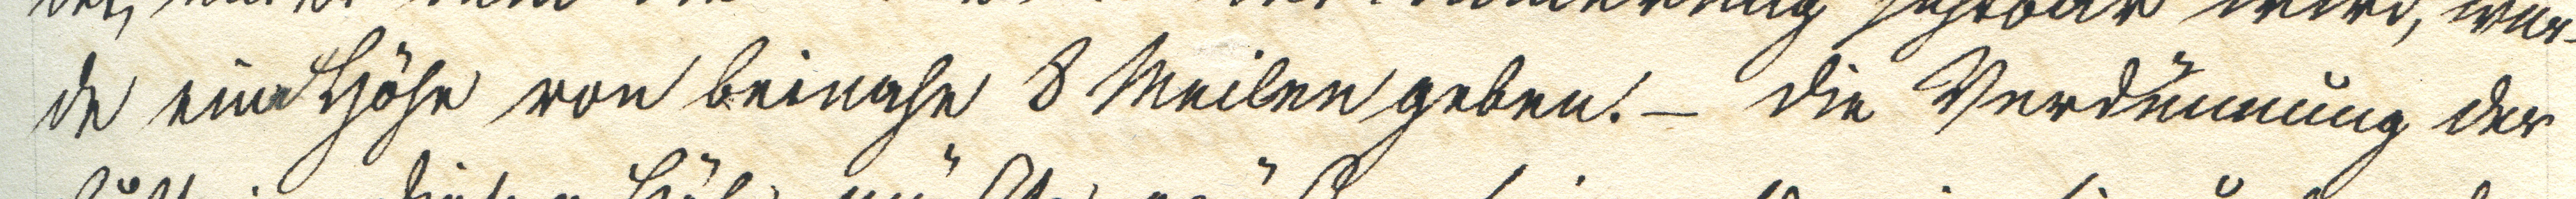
de eine Höhe von beinahe 8 Meilen geben. – Die Verdünnung der
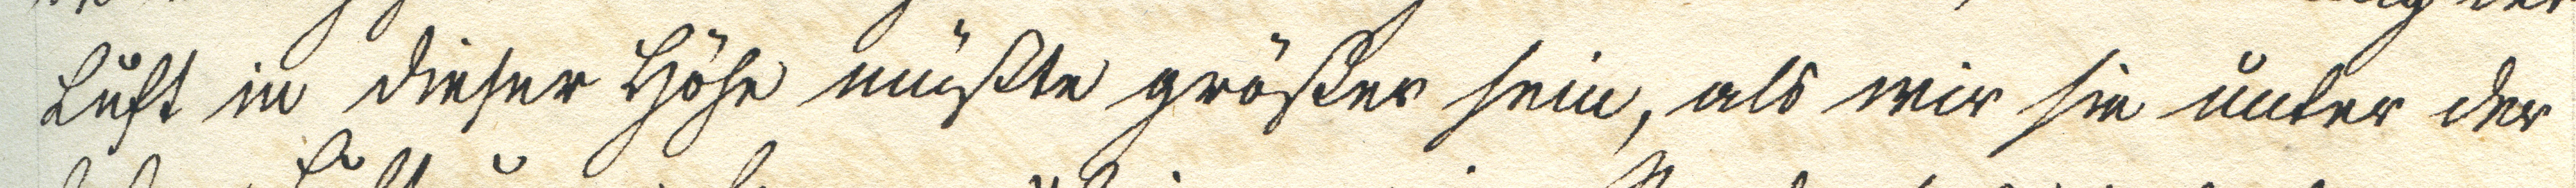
Luft in dieser Höhe müßte größer sein, als wir sie unter der
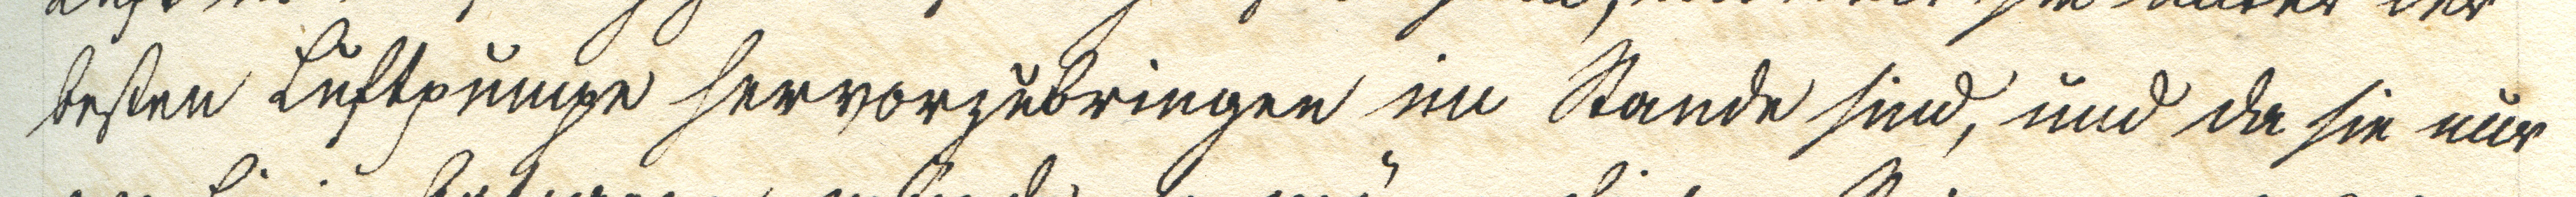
besten Luftpumpe hervorzubringen im Stande sind, und da sie nur
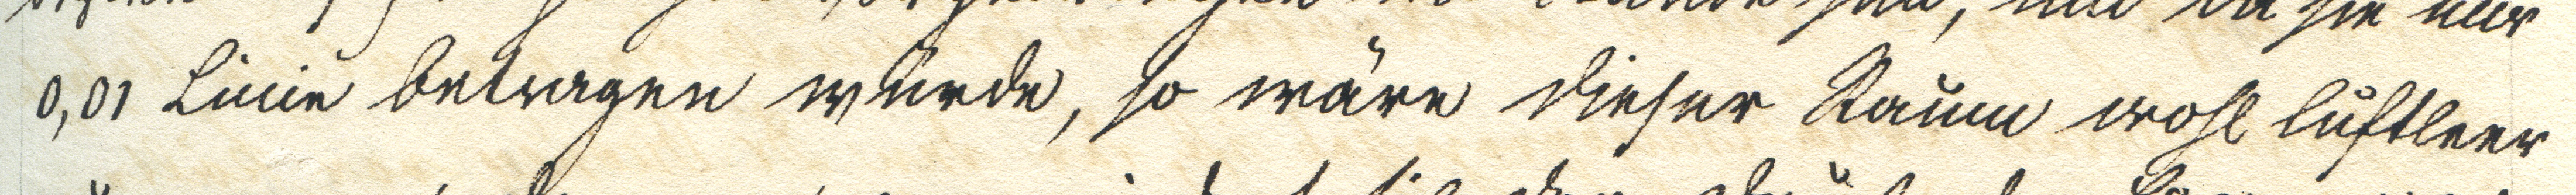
0,01 Linie betragen würde, so wäre dieser Raum wohl luftleer
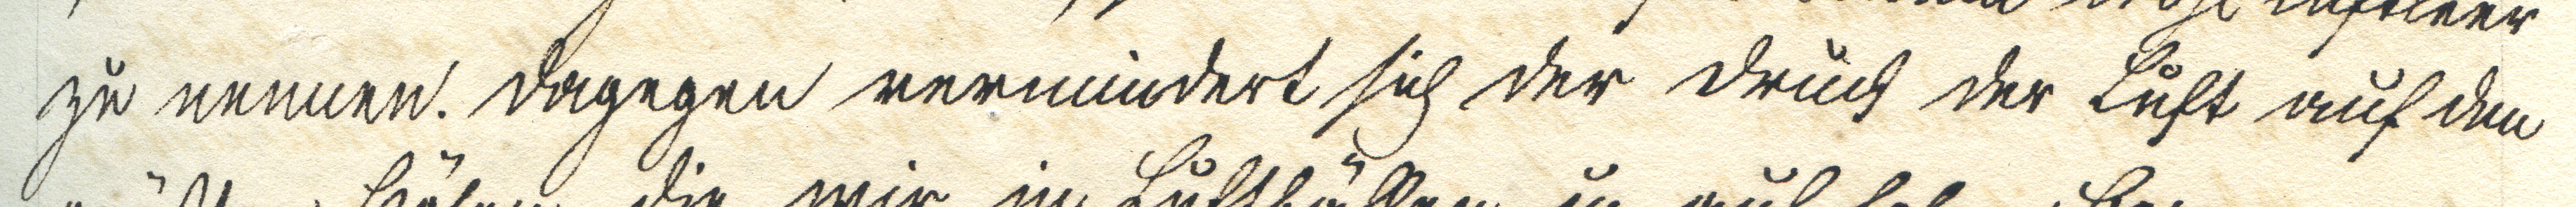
zu nennen. Dagegen vermindert sich der Druck der Luft auf den
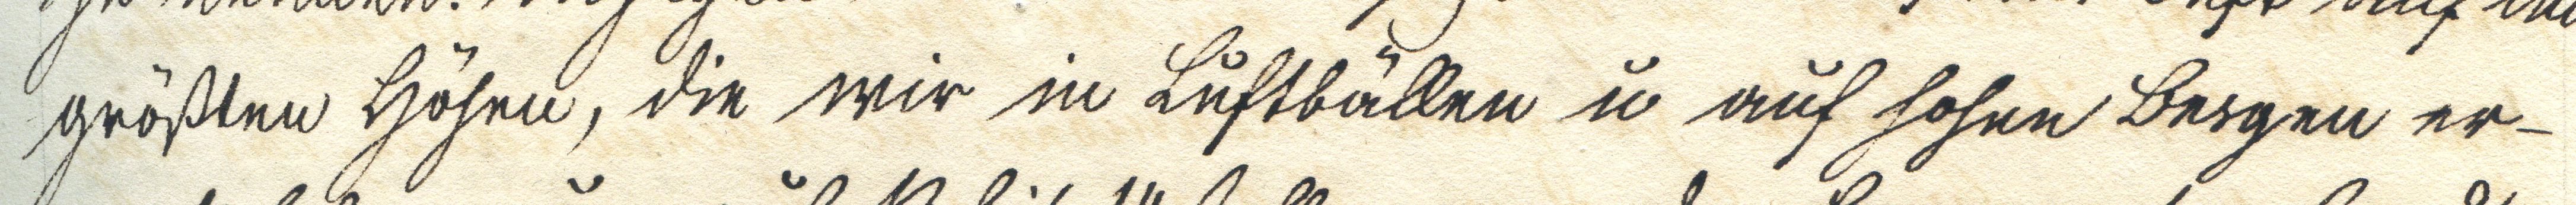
größten Höhen, die wir in Luftbällen u auf hohen Bergen er-
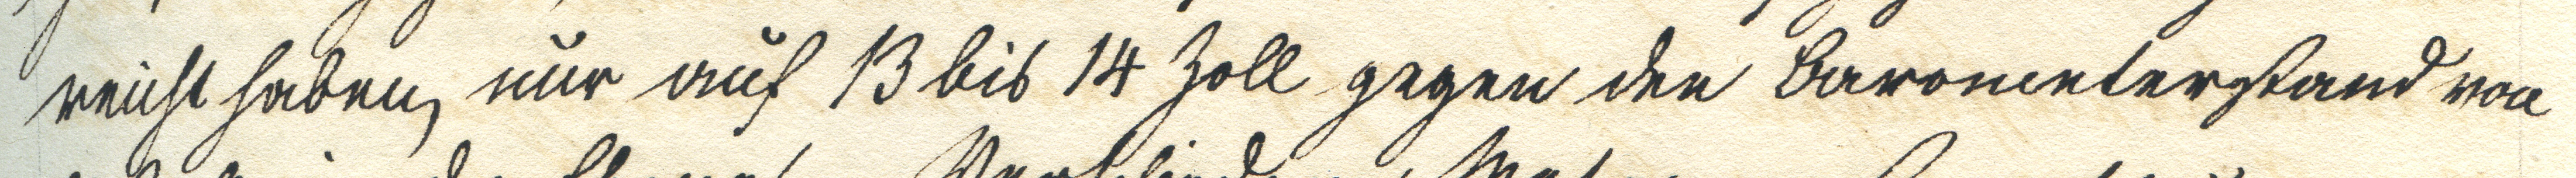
reicht haben, nur auf 13 bis 14 Zoll gegen den Barometerstand von
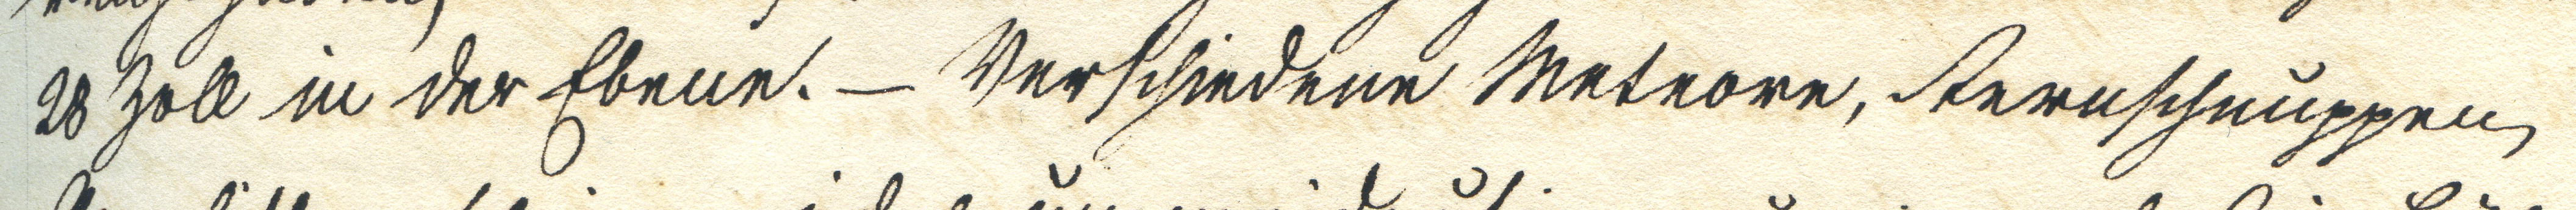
28 Zoll in der Ebene. – Verschiedene Meteore, Sternschnuppen,
